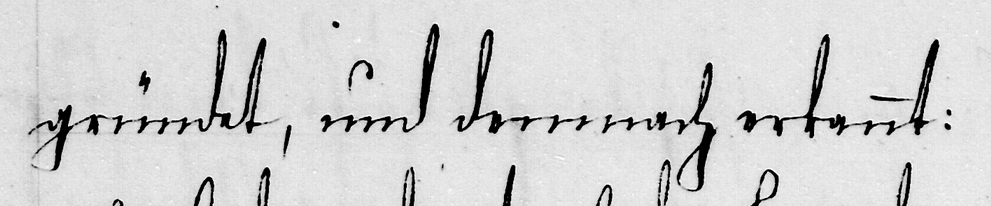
gründet, und demnach erkannt:
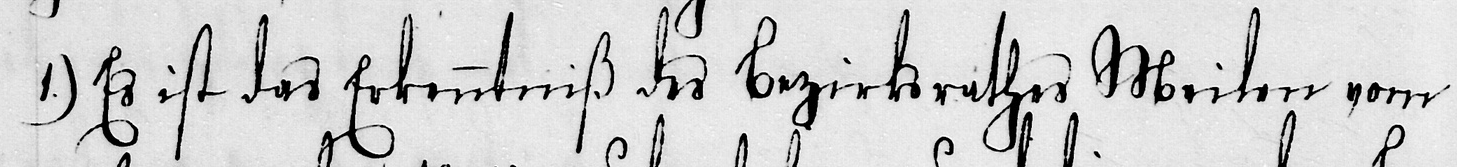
1.) Es ist das Erkenntniß des Bezirksrathes Meilen vom
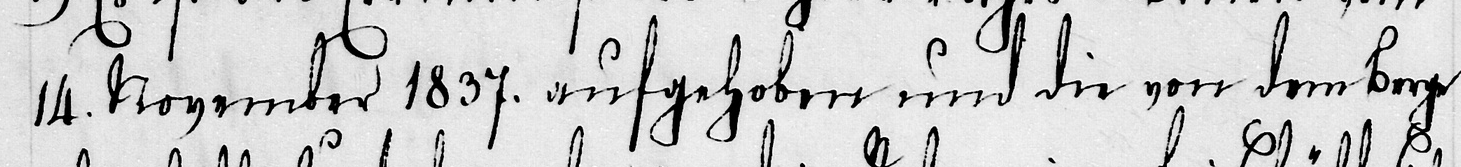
14. November 1837. aufgehoben und die von dem Berge
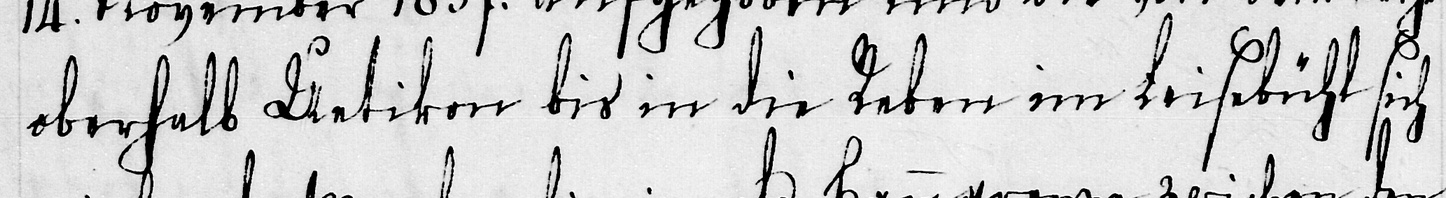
oberhalb Uetikon bis in die Reben im Leisebühl si¬
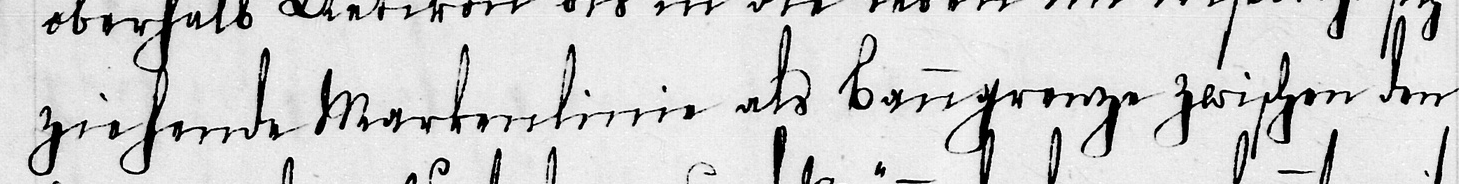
ziehende Markenlinie als Banngrenze zwischen den
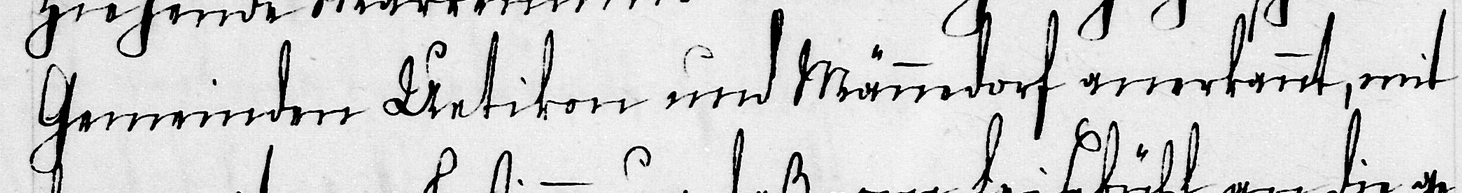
Gemeinden Uetikon und Männedorf anerkannt, mit
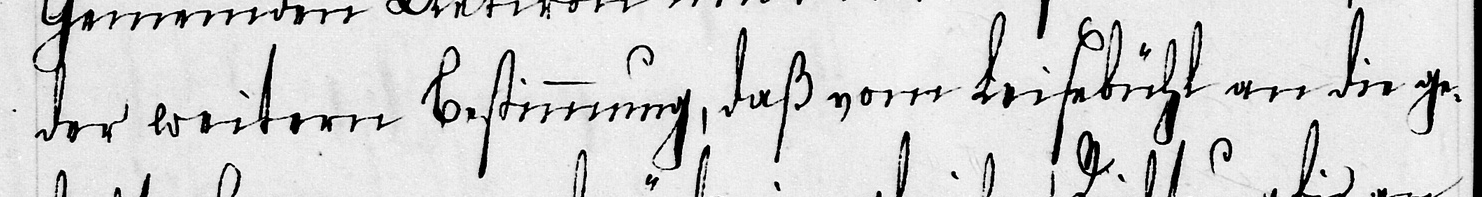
der weitern Bestimmung, daß vom Leisebühl an die ge¬
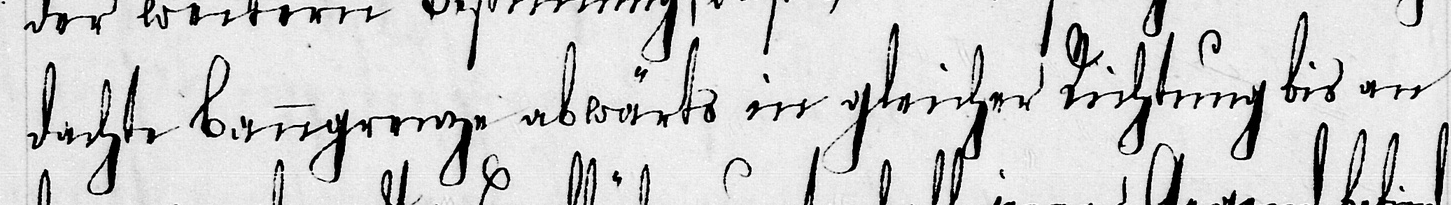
dachte Banngrenze abwärts in gleicher Richtung bis an
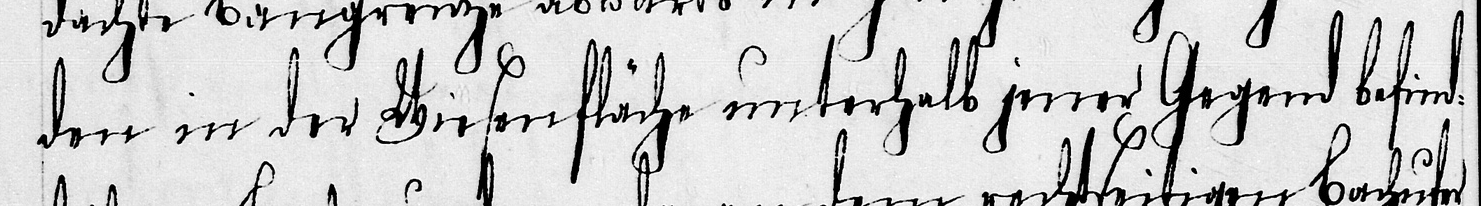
den in der Wiesenfläche unterhalb jener Gegend befin¬
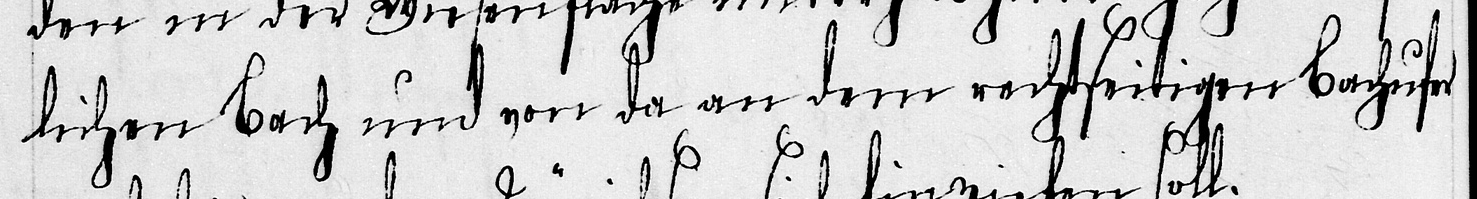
dlichen Bach und von da an dem rechtseitigen Bachufer
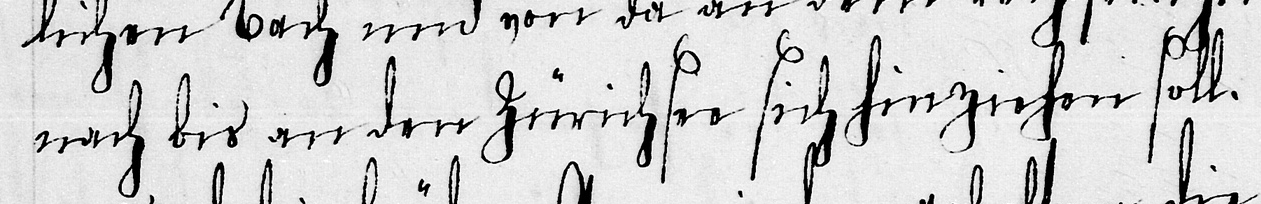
nach bis an den Zürichsee sich hinziehen soll.
